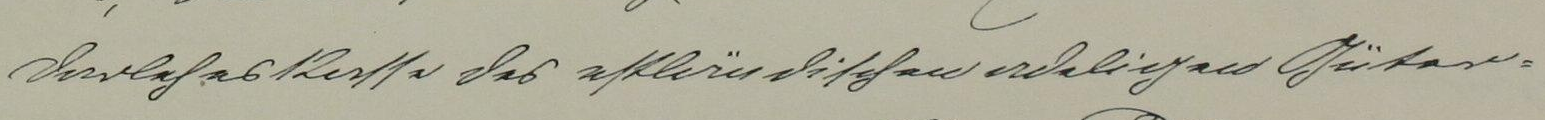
Darlehnskasse des estländischen adeligen Güter-
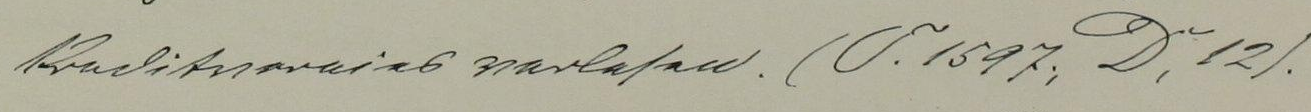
kreditvereins verlesen. (T.1597; D.12).
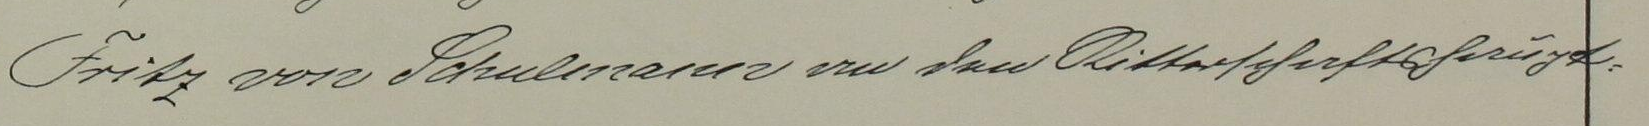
Fritz von Schulmann an den Ritterschaftshaupt-
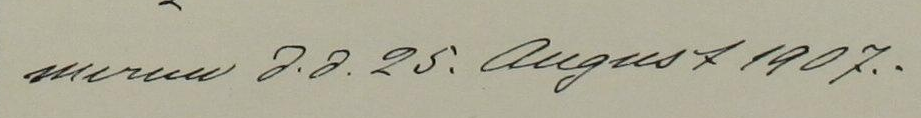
mann d.d. 25. August 1907.
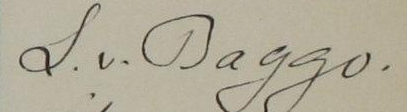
L. v. Baggo
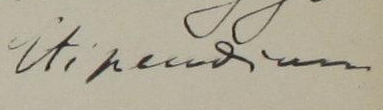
Stipendium
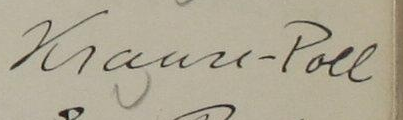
Krause-Poll.
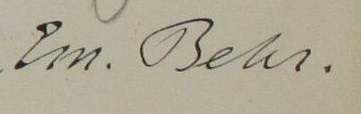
Em. Behr.
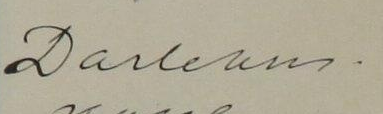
Darlehns
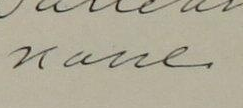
kasse.
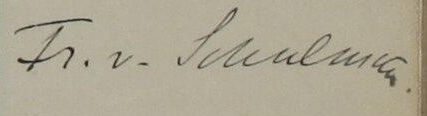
Fr. v. Schulmann
